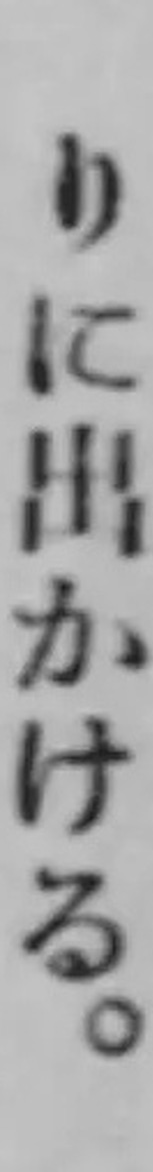りに出かける。
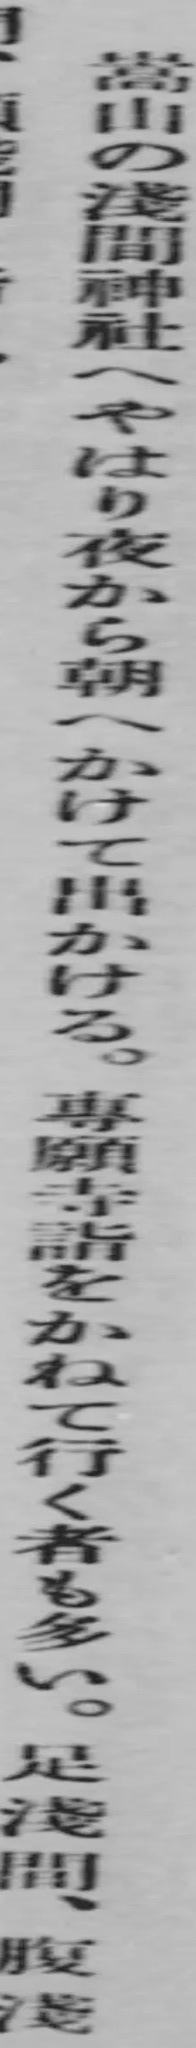嵩山の淺間神社へやはり夜から朝へかけて出かける。專願寺詣をかねて行く者も多い。足淺間、腹淺
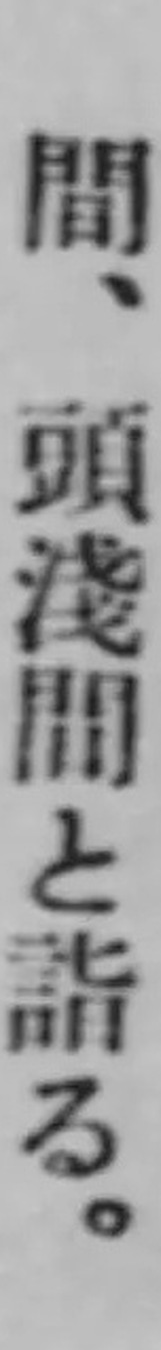間、頭淺間と詣る。
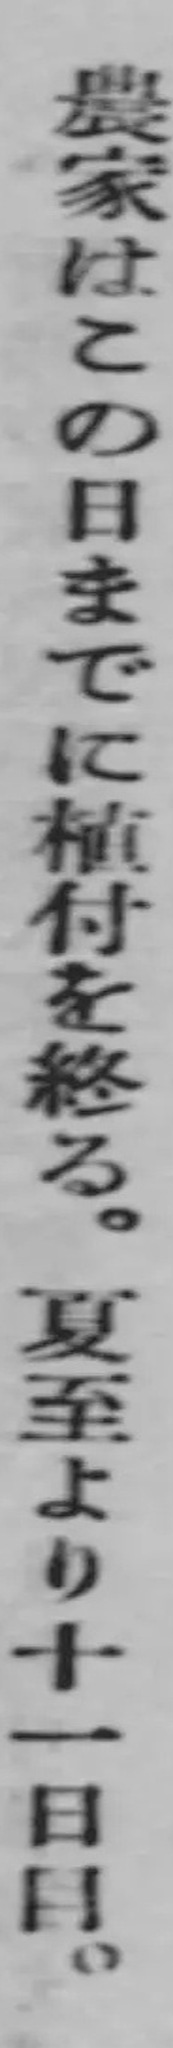農家はこの日までに植付を終る。夏至より十一日目。
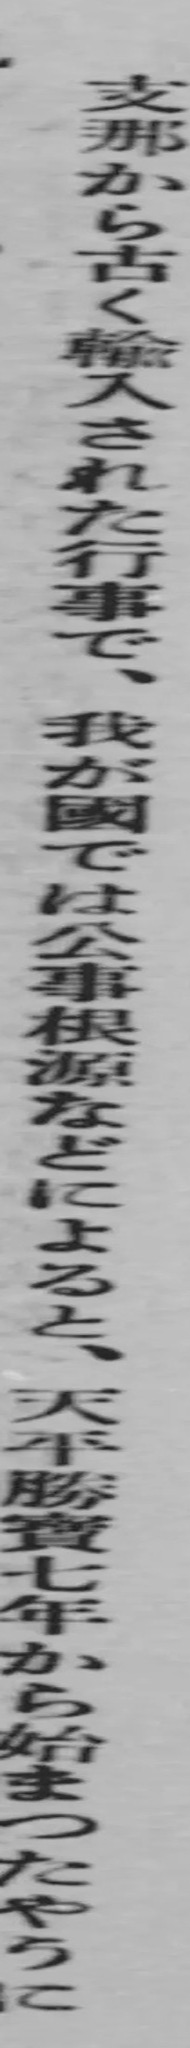支那から古く輸入された行事で、我が國では公事根源などによると、天平勝寶七年から始まつたやうに
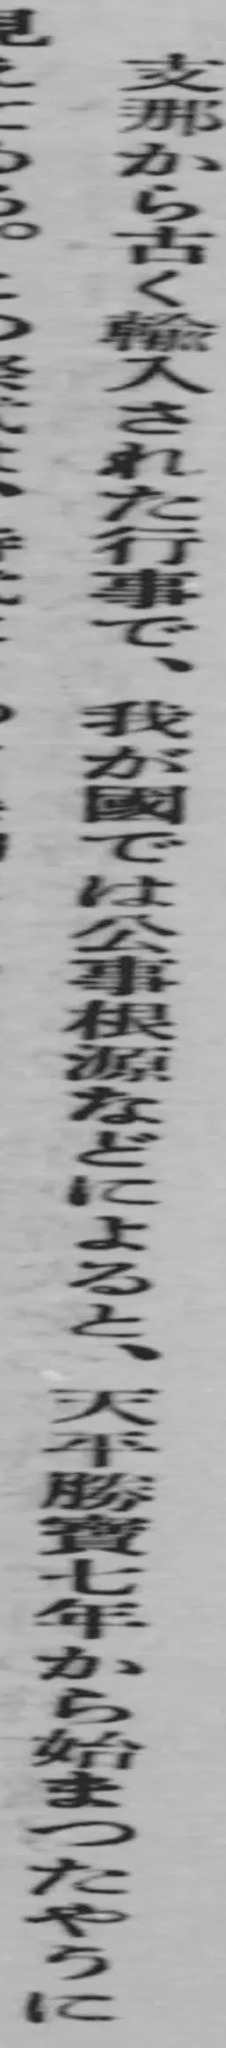支那から古く輸入された行事で、我が國では公事根源などによると、天平勝寶七年から始まつたやうに
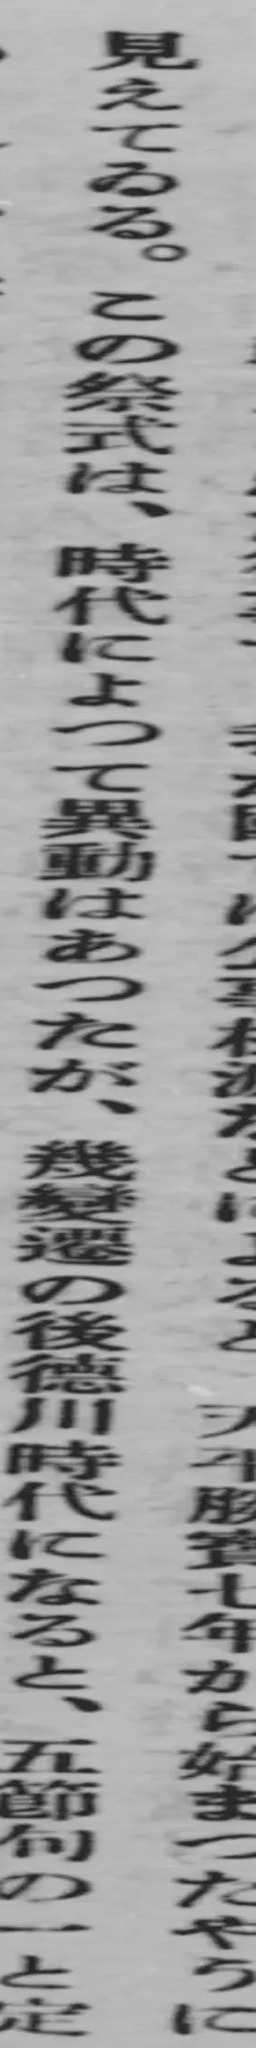見えてゐる。この祭式は、時代によつて異動はあつたが、幾變遷の後德川時代になると、五節句の一と定
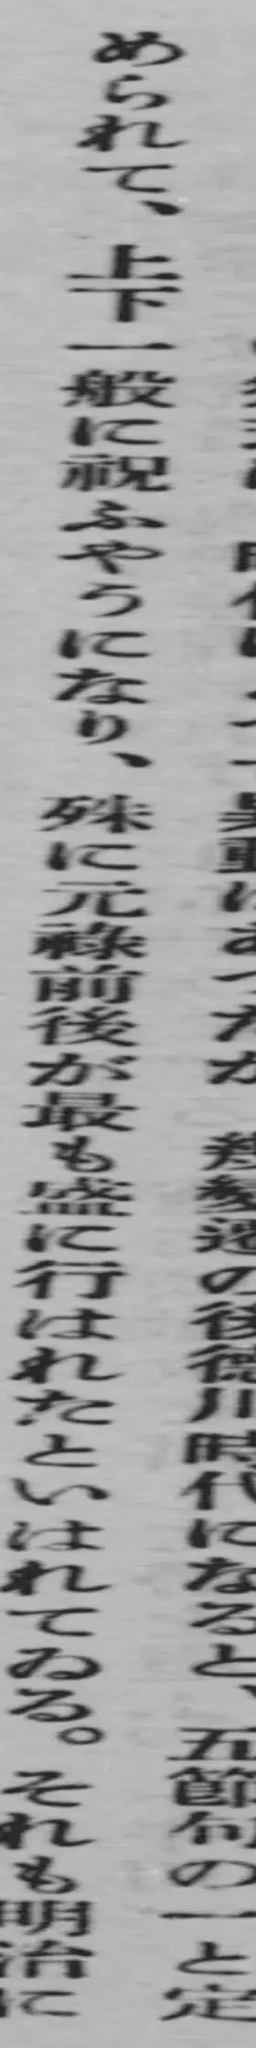められて、上下一般に祝ふやうになり、殊に元祿前後が最も盛に行はれたといはれてゐる。それも明治に
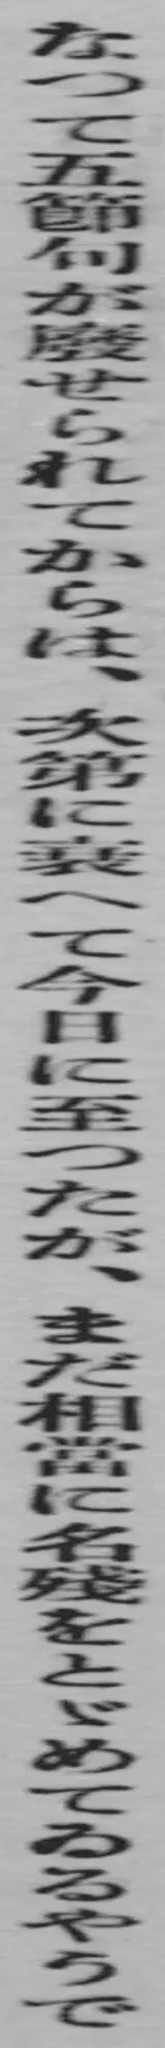なつて五節句が廢せられてからは、次第に衰へて今日に至つたが、まだ相當に名殘をとゞめてゐるやうで
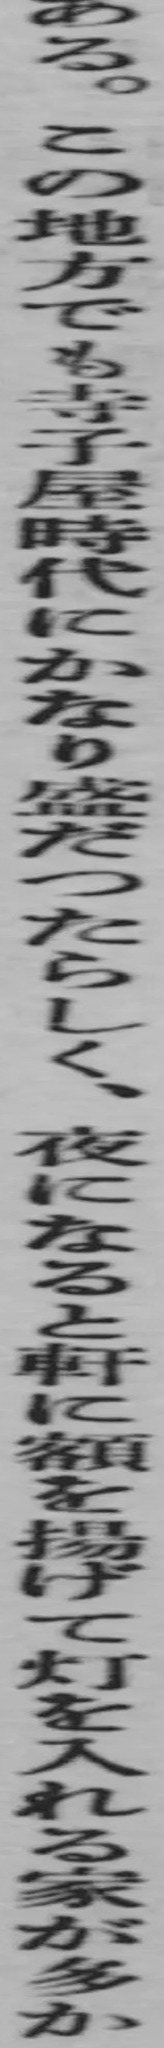ある。この地方でも寺子屋時代にかなり盛だつたらしく、夜になると軒に額を揚げて灯を入れる家が多か
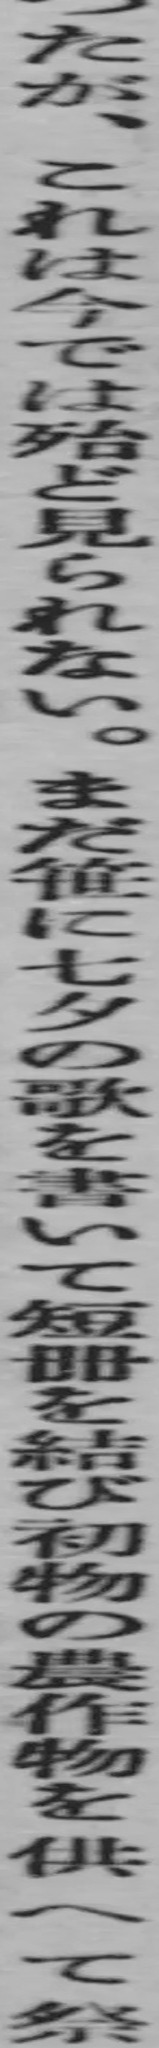つたが、これは今では殆ど見られない。まだ笹に七夕の歌を書いて短冊を結び初物の農作物を供へて祭
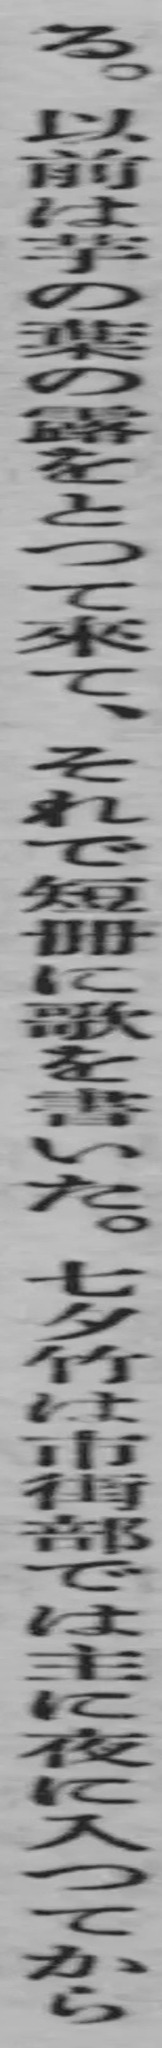る。以前は芋の葉の露をとつて來て、それで短冊に歌を書いた。七夕竹は市街部では主に夜に入つてから
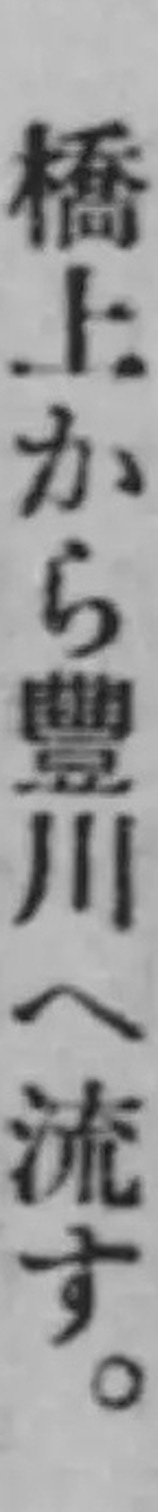橋上から豐川へ流す。
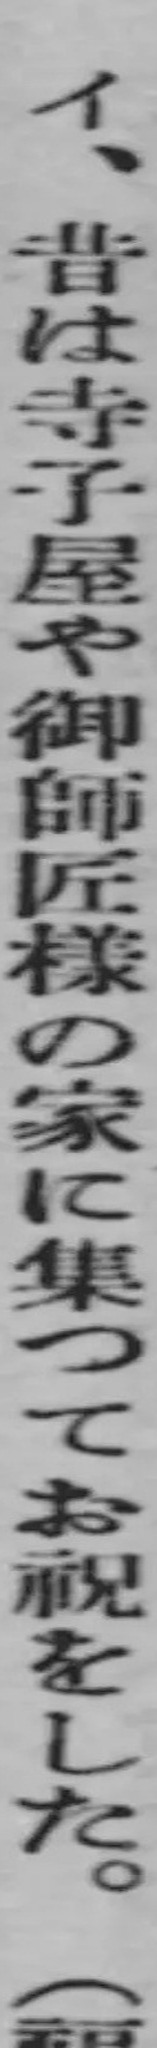イ。昔は寺子屋や御師匠様の家に集つてお祝をした。(福岡)
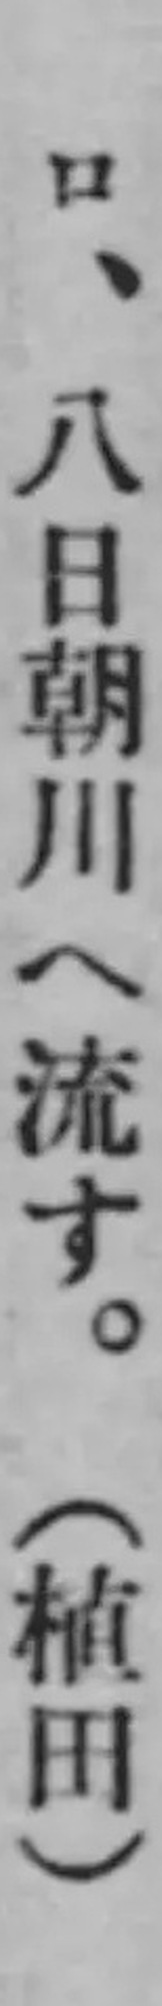ロ、八日朝川へ流す、(植田)
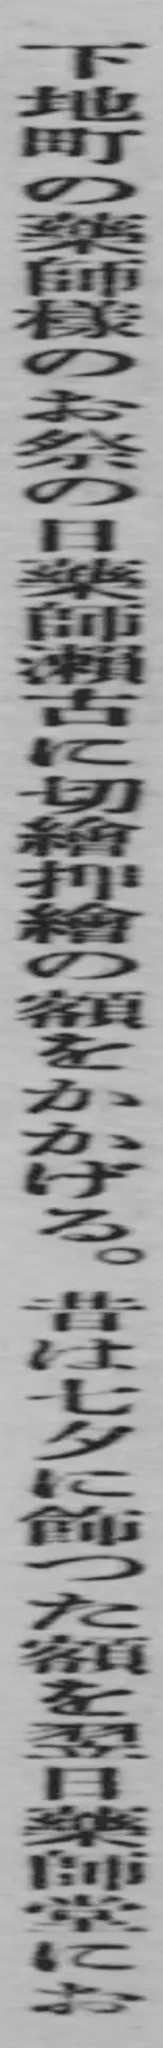下地町の藥師様のお祭の日藥師瀬古に切繪押繪の額をかかげる。昔は七夕に飾つた額を翌日藥師堂にお
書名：豊橋の年中行事
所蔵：国立国会図書館 National Diet Library, JAPAN
